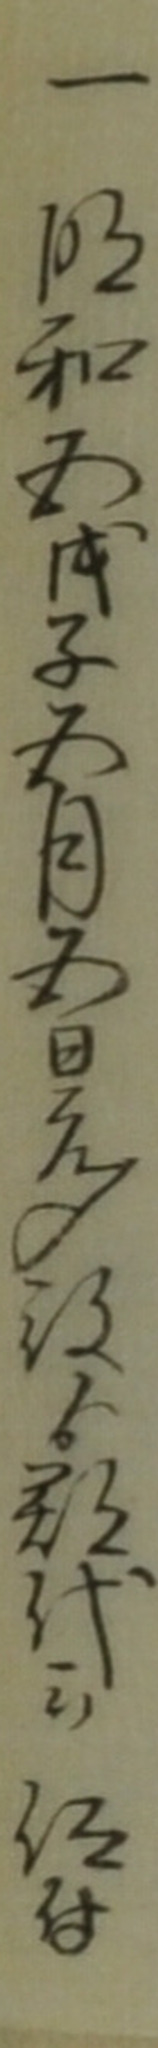一明和五戊子五月五日元〆役ゟ郡代被仰付
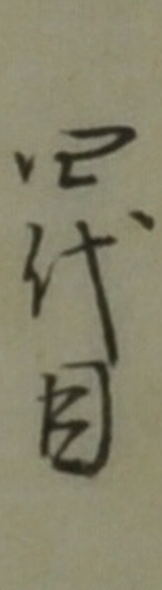四代目
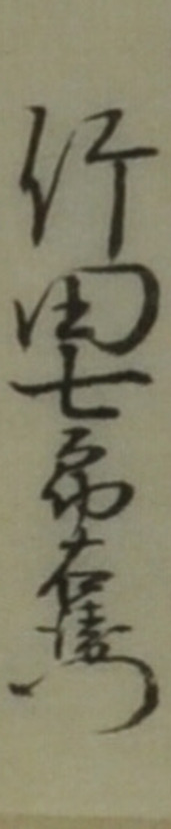竹田七郎右衛門
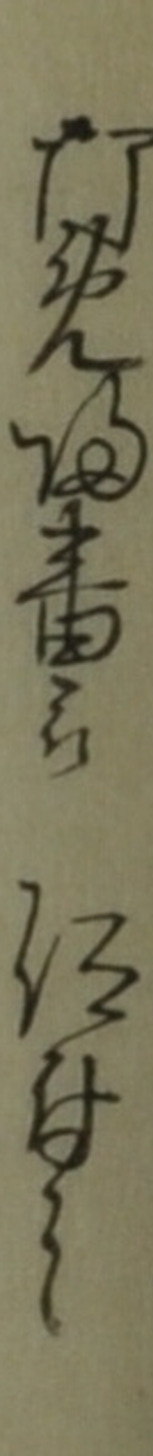御免帰番被仰付之
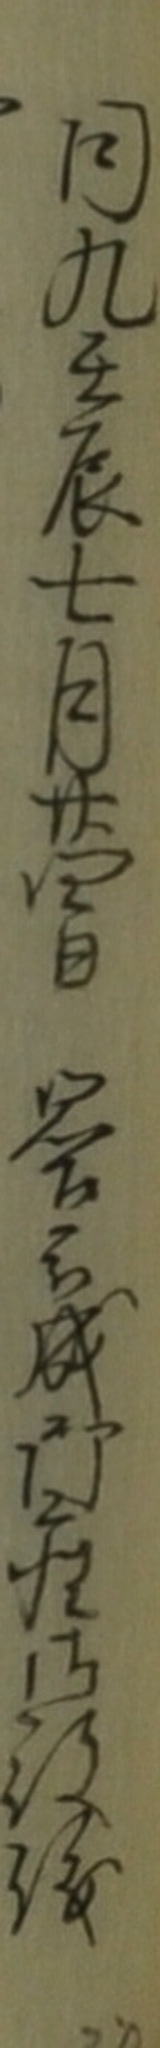一同九壬辰七月廿四日思召被成御座御役儀
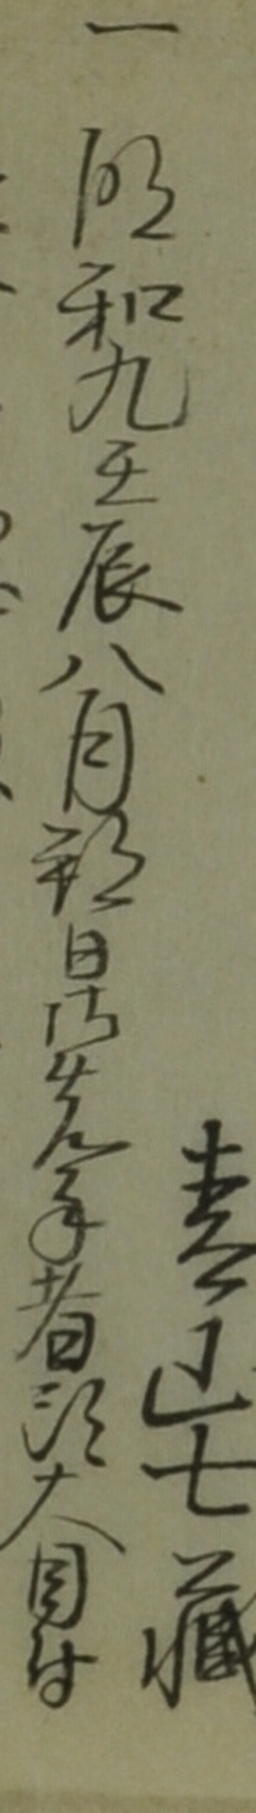一明和九壬辰八月朔日御先手者頭大目付
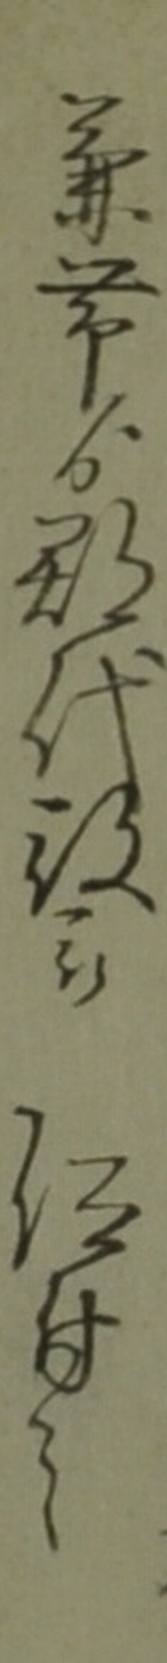兼帯ゟ郡代役被仰付之
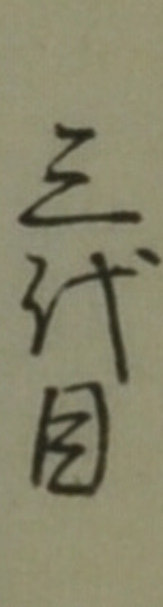三代目
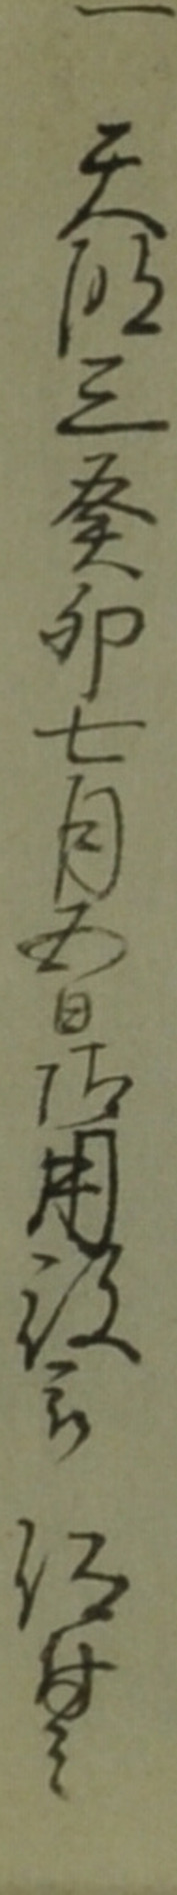一天明三癸卯七月五日御用役被仰付之
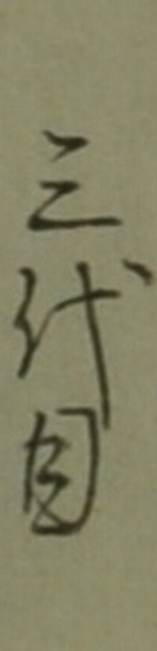三代目
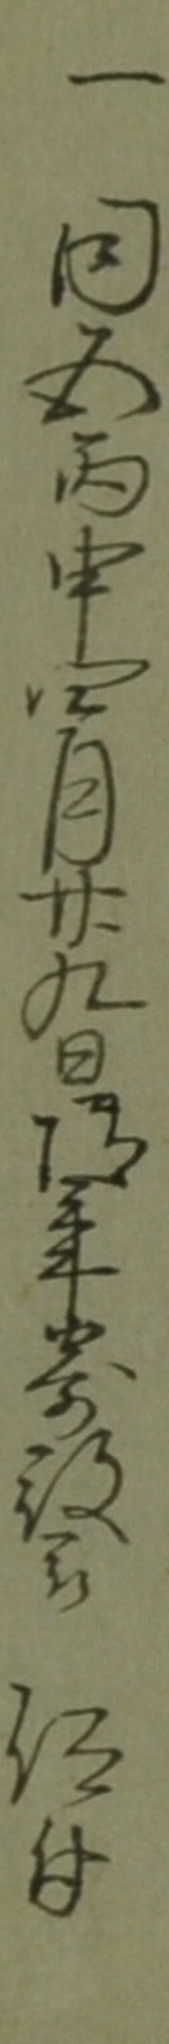一同五丙申四月廿九日御年寄役被仰付
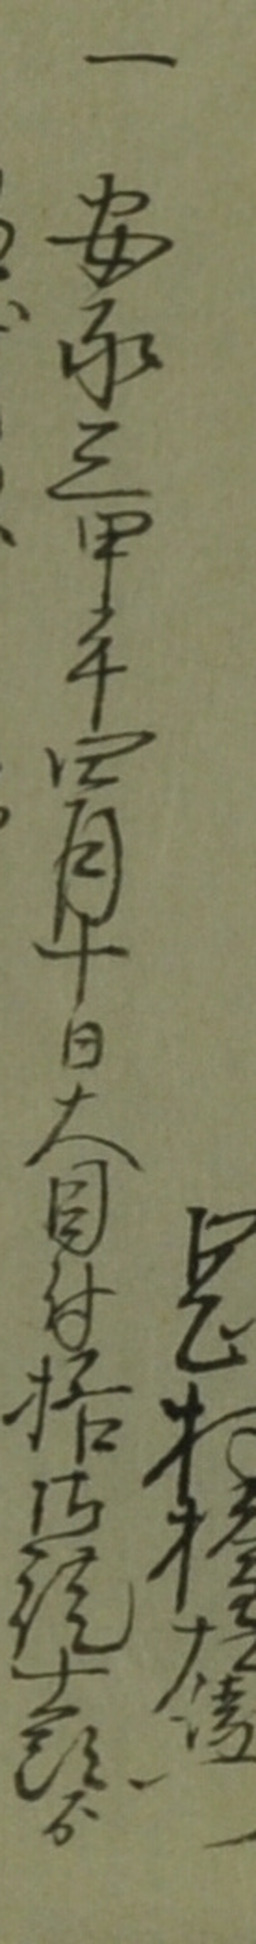一安永三甲午四月十日大目付格御徒士頭ゟ
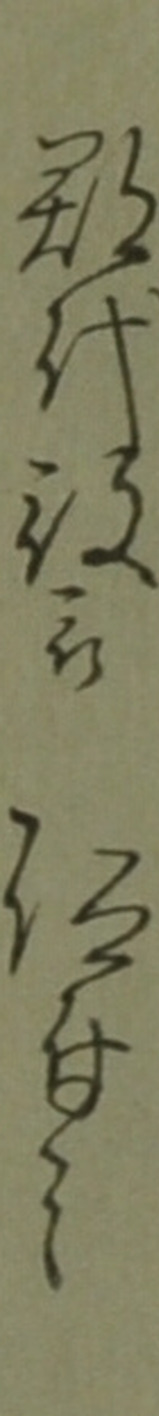郡代役被仰付之
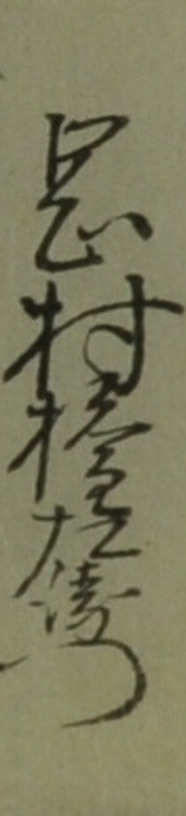岡村権左衛門
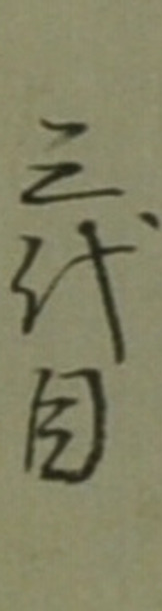三代目
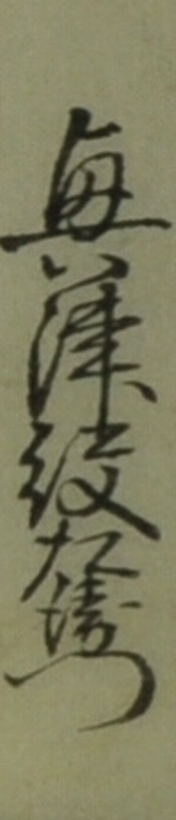奥津紋左衛門
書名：諸御役代々録（二）
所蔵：伊那市立高遠町図書館・合同会社AMANE
